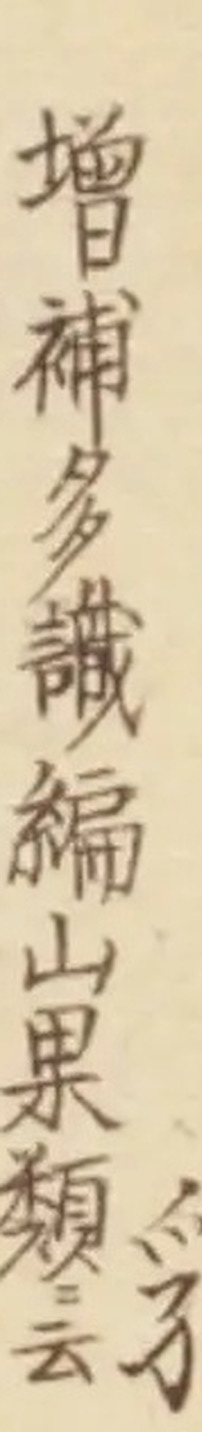増補多識変編山果類に云
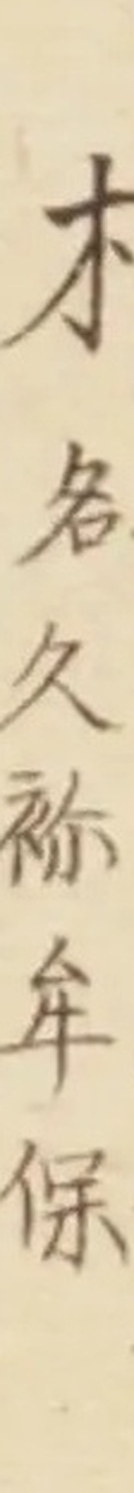名久祢牟保寫
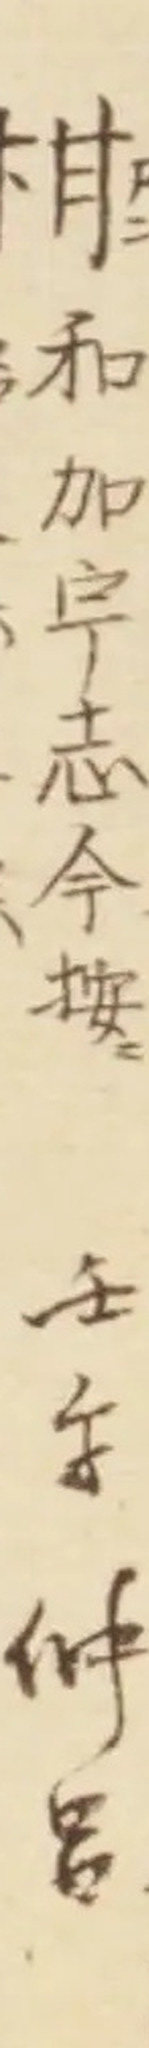柑和加宇志今按に壬午仲呂
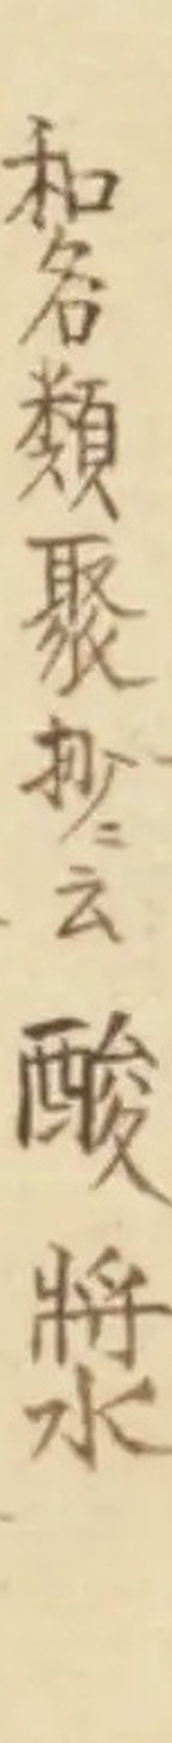和名類聚抄に云酸漿
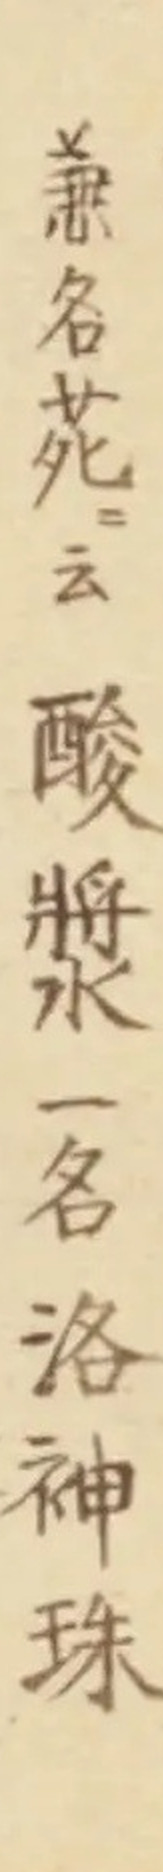兼名苑に云酸漿一名洛神珠
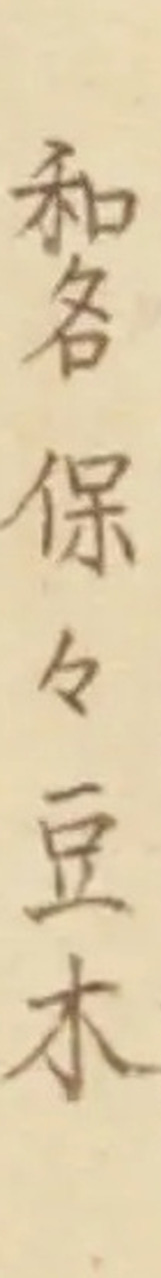和名保々豆木
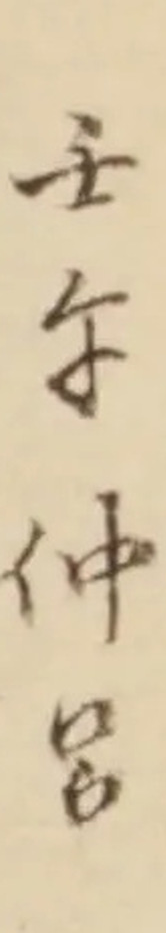壬午仲呂
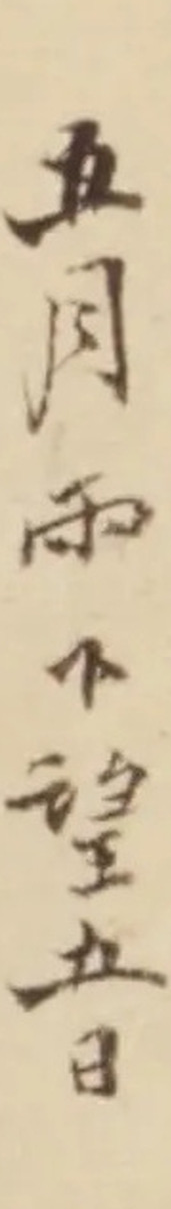五月雨下望五日
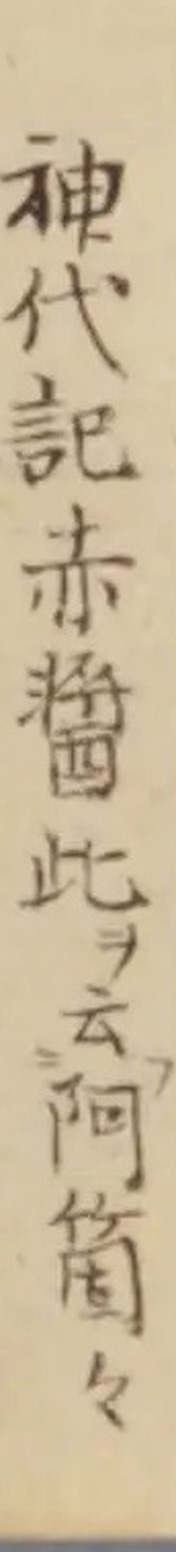神代記赤醤此を云ふ箇々

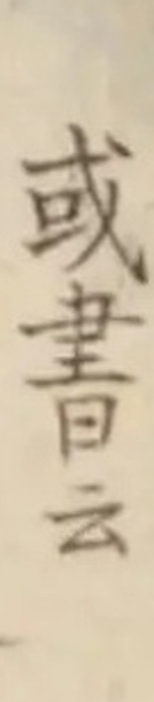或書云
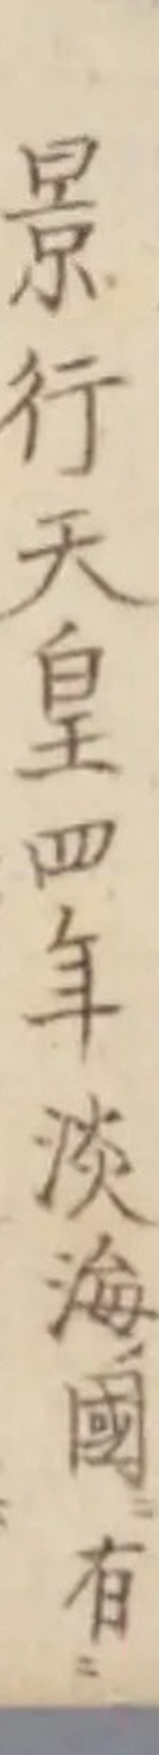景行天皇四年淡海國に有
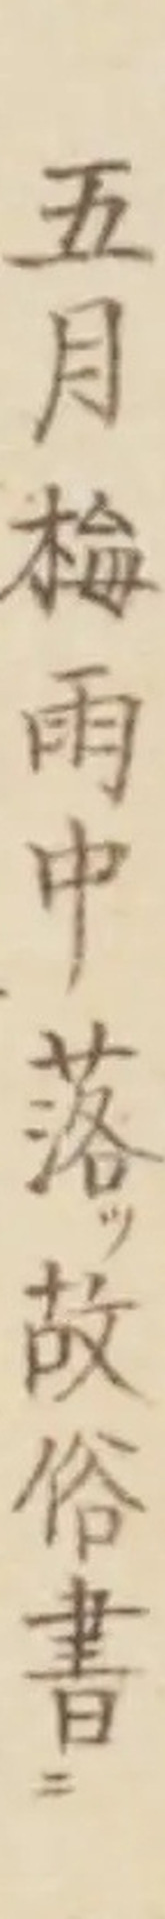五月梅雨中落つ故俗所
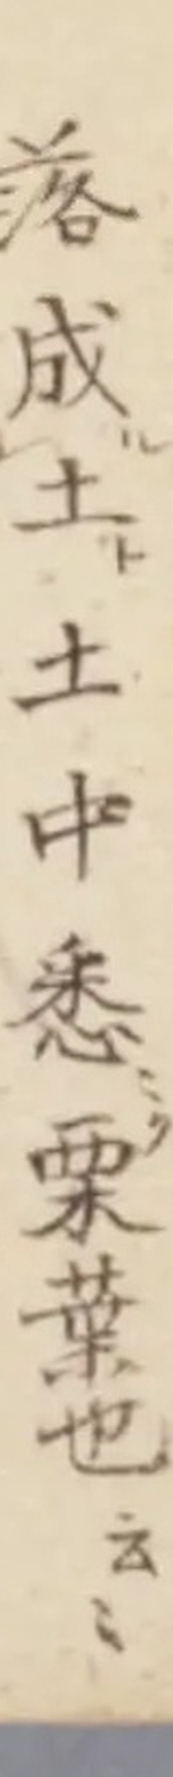落成る土と土中悉く栗葉也云々
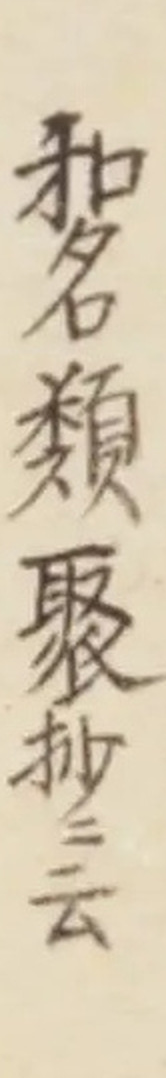和名類聚抄に云
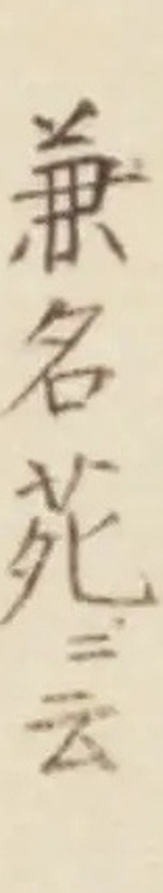兼名苑に云
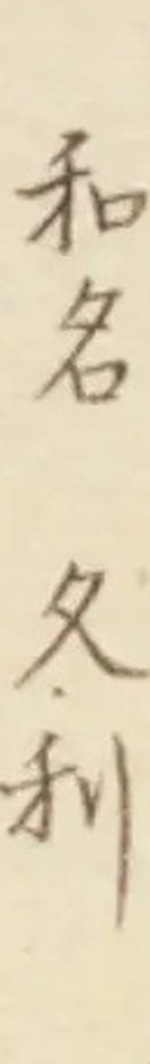和名久利
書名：梅園草木花譜夏之部. 1
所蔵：国立国会図書館 National Diet Library, JAPAN
